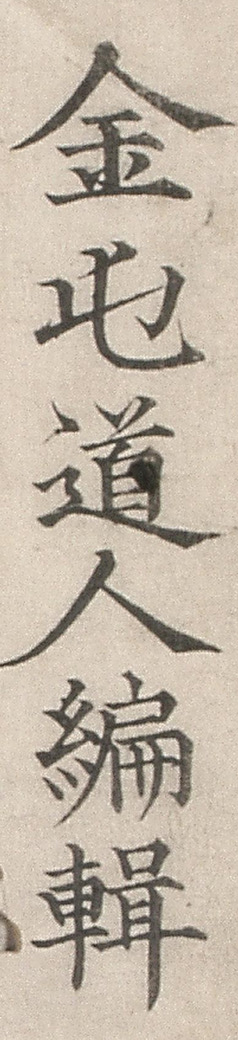金屯道人編輯
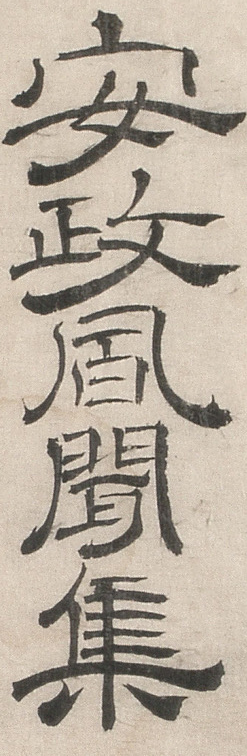安政風聞集
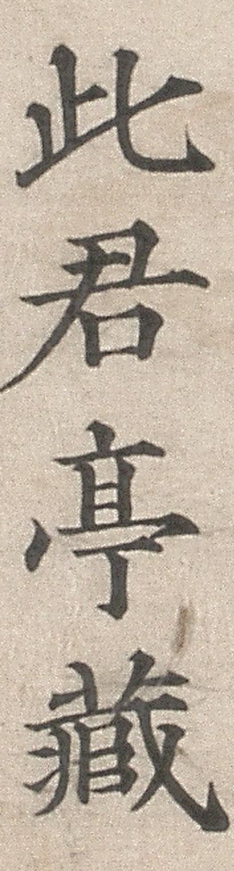此君亭蔵
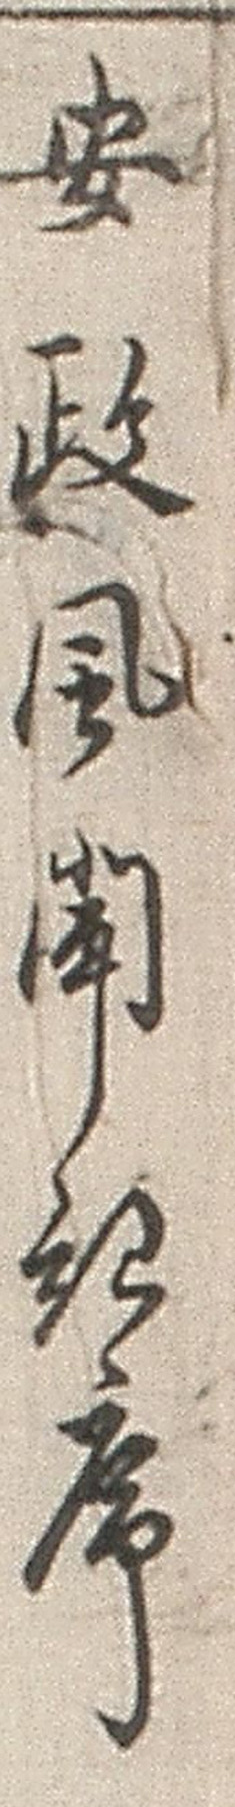安政風聞紀序
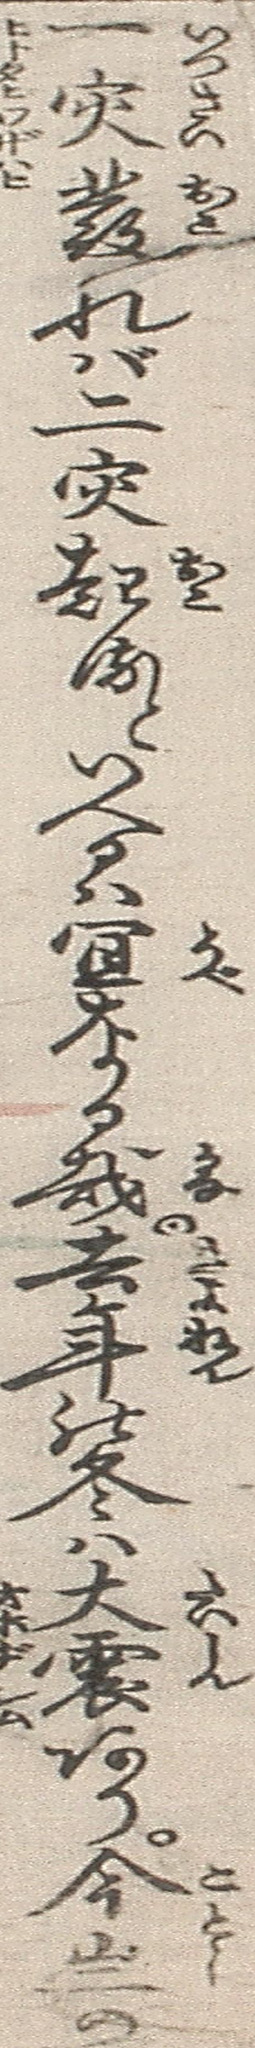一災発れバ二災起るといへるハ宣なるか哉。去年の冬ハ大震あり。今亗の
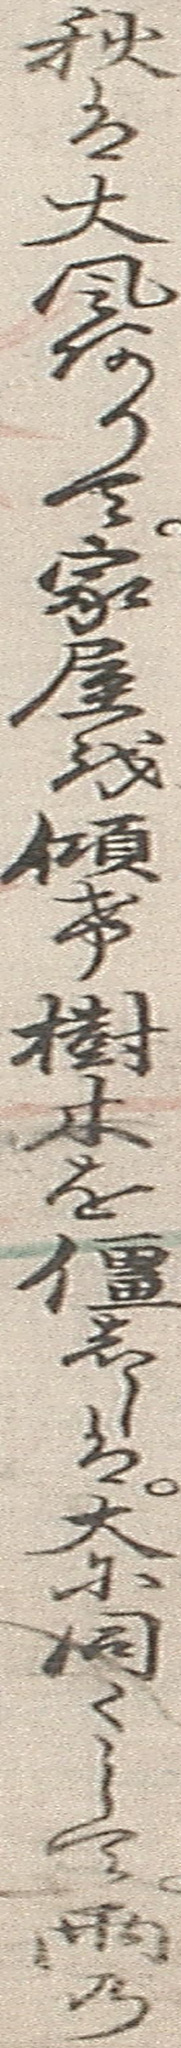秋は大風ありて。家屋を傾け樹木を僵ししは大に同くして。雨の
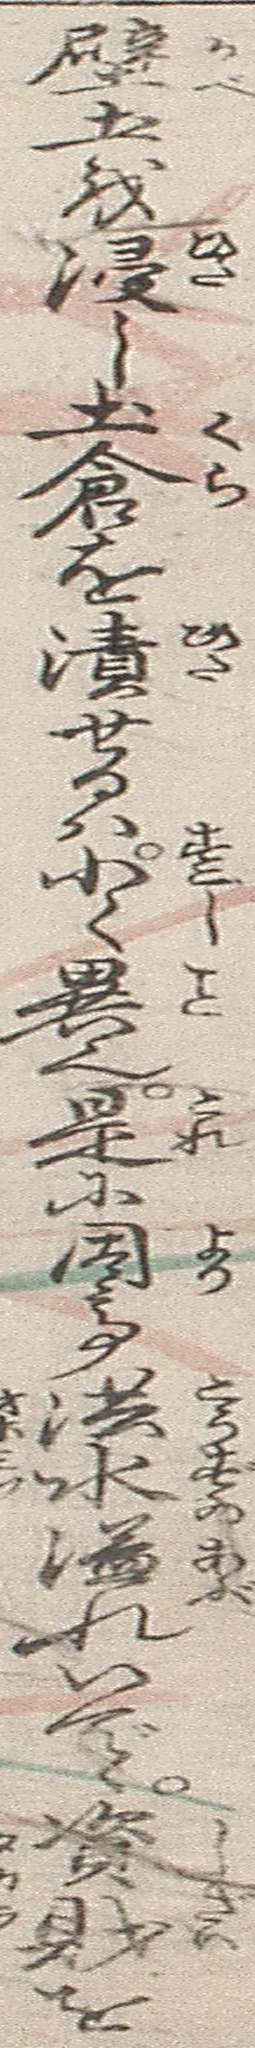壁土を浸し土倉を漬せるハ。小く異也。是に因て洪水溢れいで資財を。
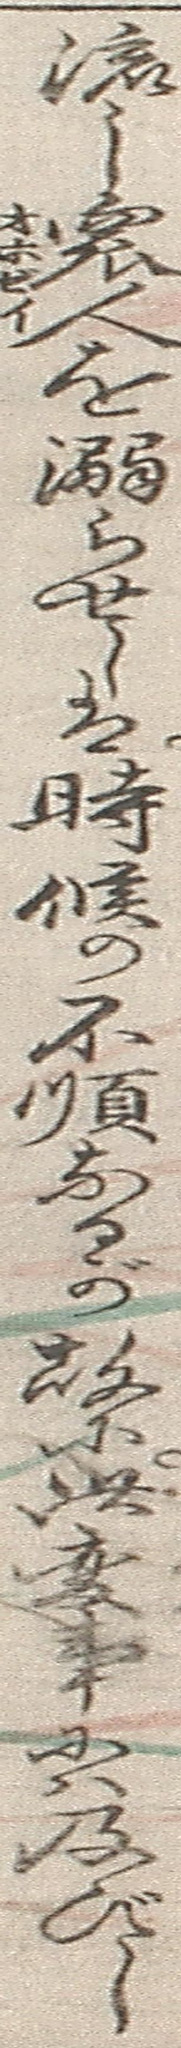流し衆人を溺らせしは。時候の不順なるが故に此変事にハ及びし
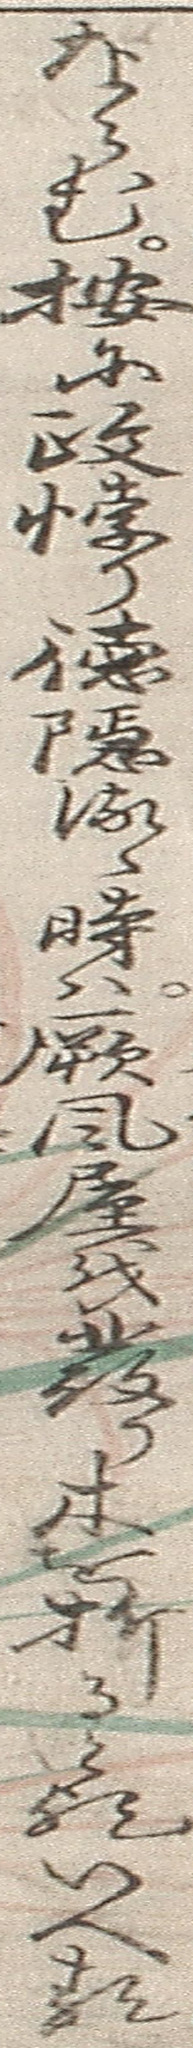ならむ。按に政悖り徳隠るゝ時ハ厥風屋を発り木を折ると歟いへる。
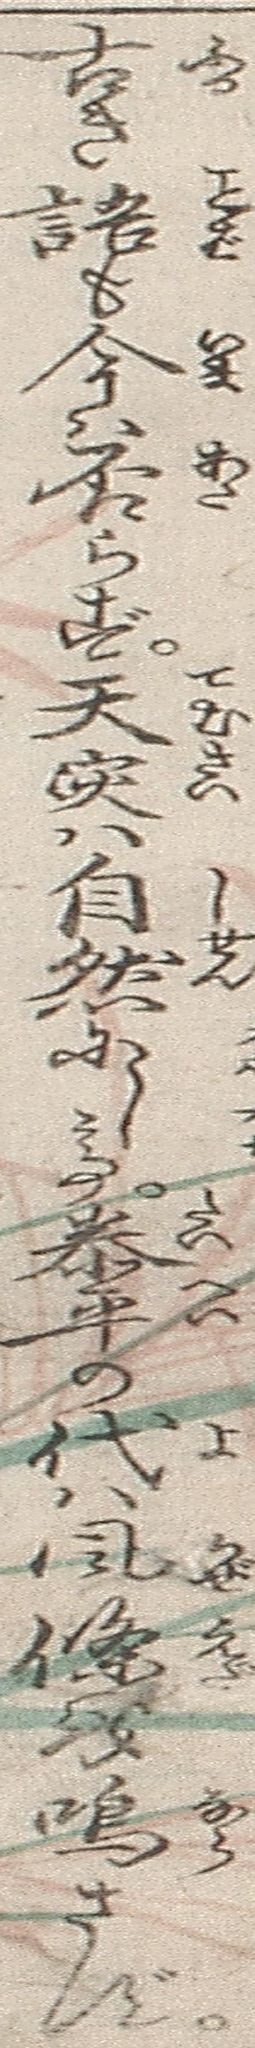古き語も今ハ否らず。天災ハ自然にして。泰平の代風條を鳴さず。
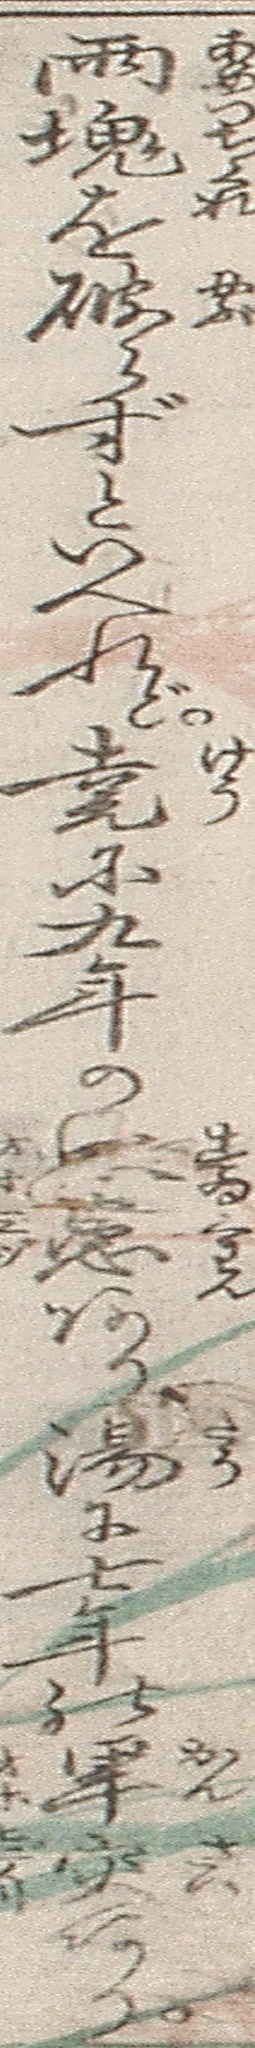雨塊を破らずといへれど。堯に九年の水患あり湯に七年の旱災あり。如是
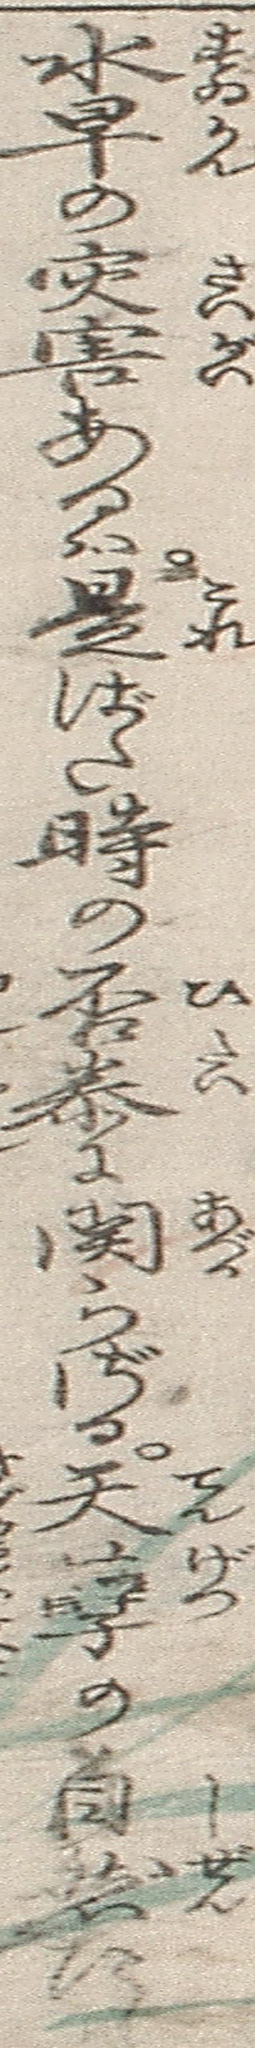水旱の災害あるハ。是ばた時の否泰に関らざる。天孽の自然なり
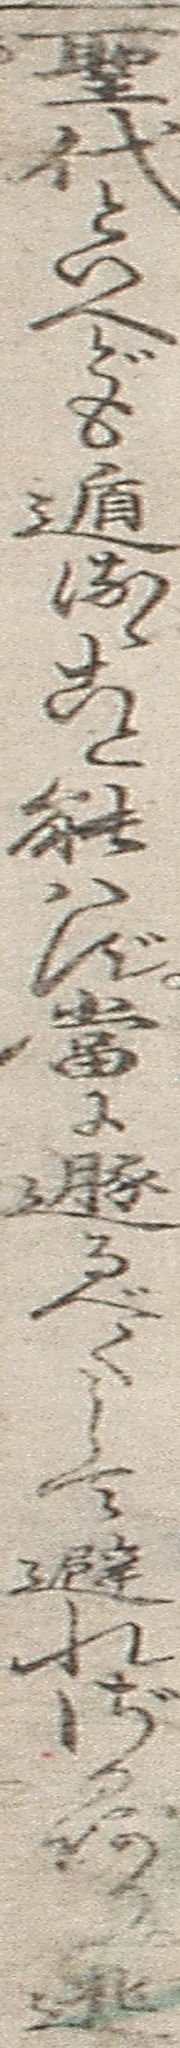聖代といへども遁るゝこと能ハず。当に遯るべくして避れざるあり。逃れ

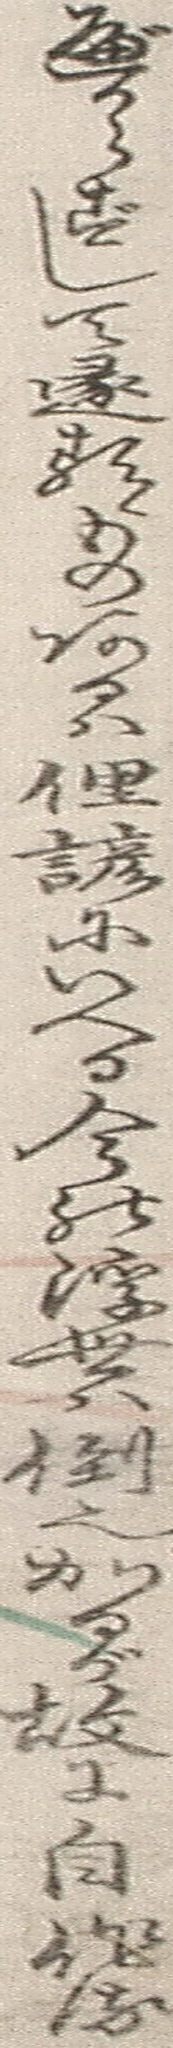べからずして遁るゝものあるハ。俚諺にいへる今の浮世ハ倒也。かゝるが故に自作る
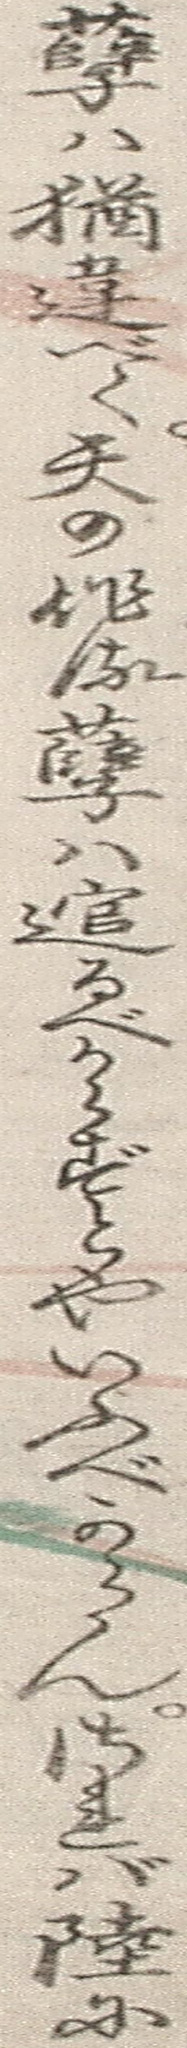孼ハ猶違べく天の作る孼ハ逭るべからずとやいふべからん。されバ陸に
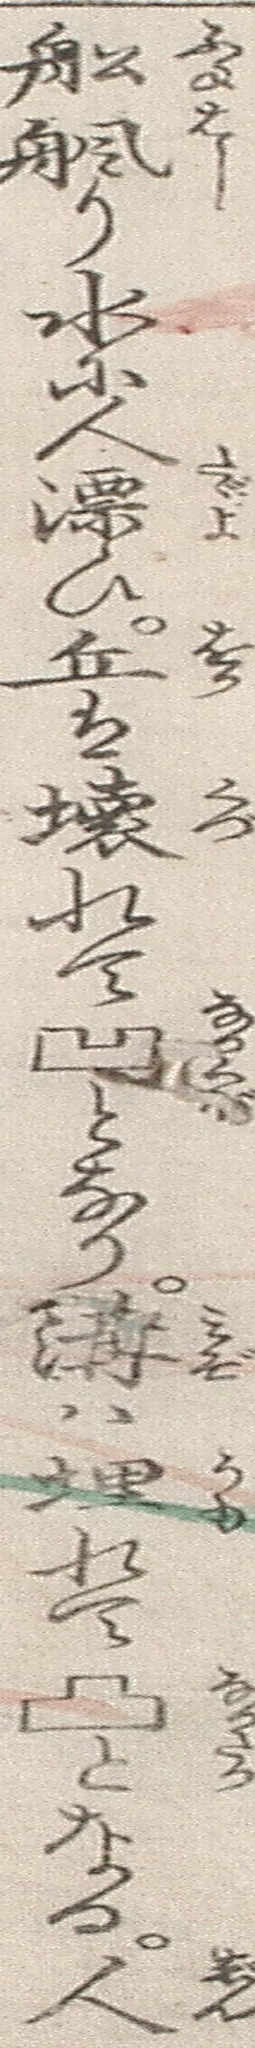船帆り水に人漂ひ。丘は壊れて凹となり。溝ハ埋れて凸となる。人
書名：安政風聞集　上中下　全
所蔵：東京大学地震研究所図書室 Earthquake Research Institute Library, The University of Tokyo, JAPAN
